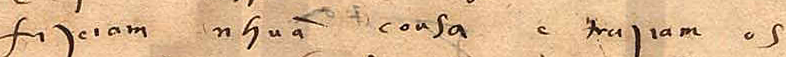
fizeram nhuā cousa e traziam os
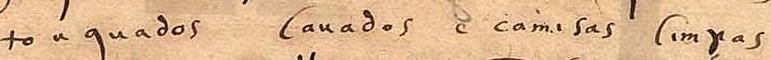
touquados lauados e camisas limpas
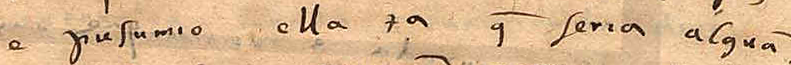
e presumio ella ta q̅ seria alguā
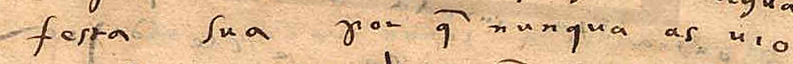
festa sua por q̅ nunqua as uio
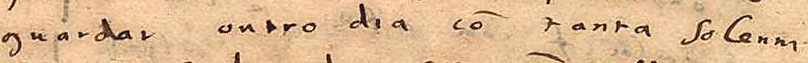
guardar outro dia co̅ tanta solenni
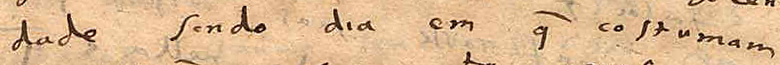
dade sendo dia em q̅ costumam
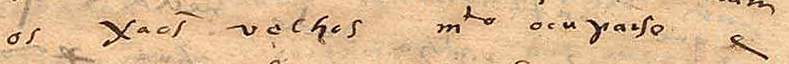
os xaos̄ velhos mto ocuparse e
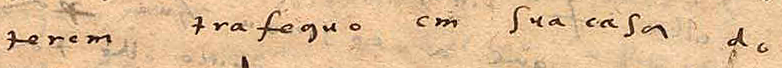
terem trafeguo em sua casa do
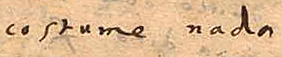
costume nada
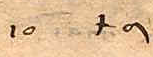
10 ta
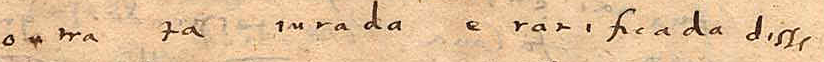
outra ta iurada e ratificada disse
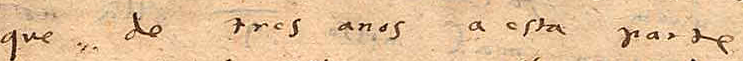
que de tres anos a esta parte
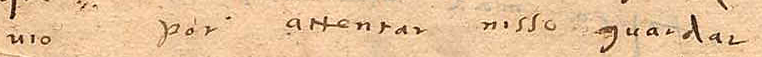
uio por attentar nisso guardar
